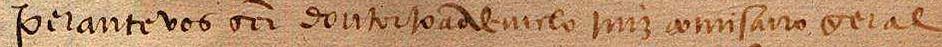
Perante vos sōr doutor João de melo Juiz comisairo geral
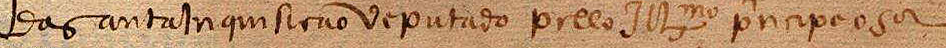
da santa Jnquysicão deputado pello JlLmo pincipe o Sor
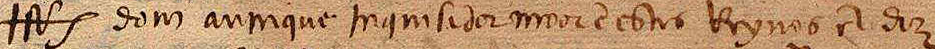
Jffꝭ dom anrrique Jnquisidor moor ē estes Reynos c̄ diz
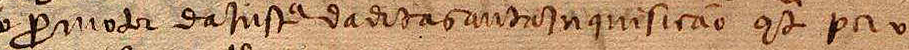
o ꝓmotor da Justa da dita santa Jnquisicão ꝯt̄ pero
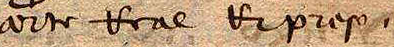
corte Real R preso ,
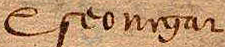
e se o negar
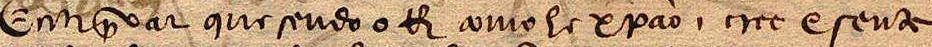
Ent p̄var que sendo o R como he xpão , cree e sente
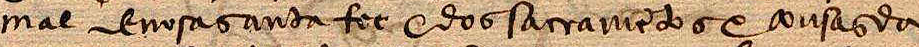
mal de nosa santa fee e dos sacramētos e cousas da
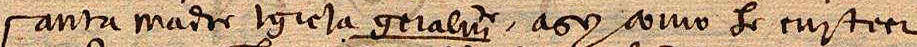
santa madre IgeJa geralmte , asy como he em teer
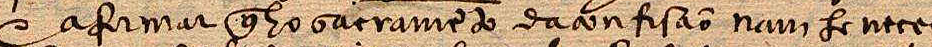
e afermaar q̄ ho sacramēto da confisão nam he neçe
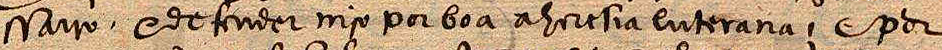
ssarjo , e defender niso por boa a heresia luterana , e por
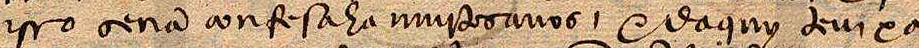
isso se nā confesa ha mujtos anos , e daquy tem e a
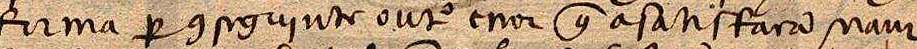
firma ꝑ ꝯsegujnte outo error q̄ a satisfaçā nam
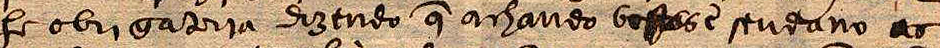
he obrigatorja dizendo q̄ achando bestas ē seu dano as
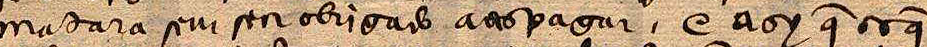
matara sem seer obrjgado a as pagar , e asy q̄ os q̄
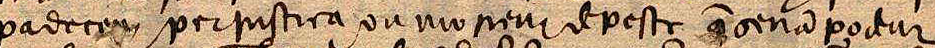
padeçem per justiça ou morrem de peste q̄ se nā podem
